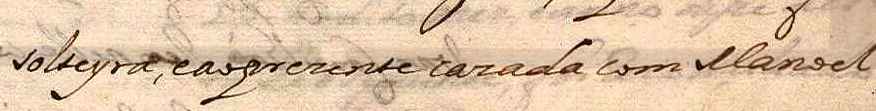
solteyra, e ao prezente cazada com Manoel
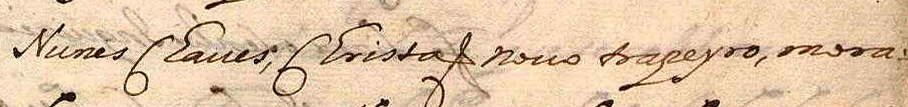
Nunes Chaues, Christaõ nouo trapeyro, mora
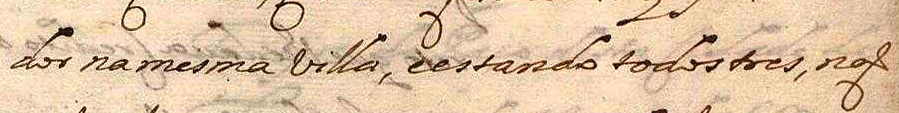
dor na mesma villa, e estando todos tres, naõ
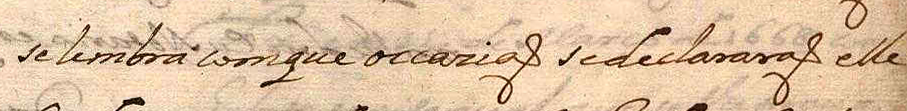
se lembra com que occaziaõ se declararaõ elle
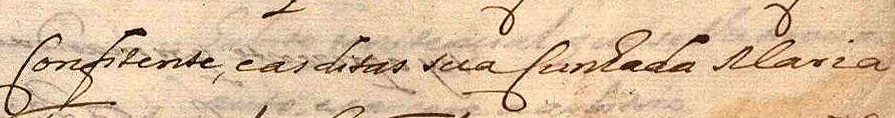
Confitente, e as ditas sua Cunhada Maria
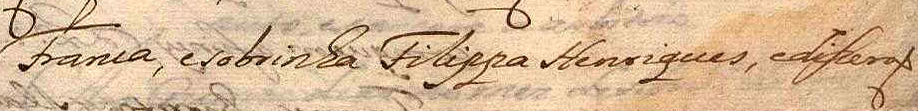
Franca, e sobrinha Filippa Henriques, e disseraõ
